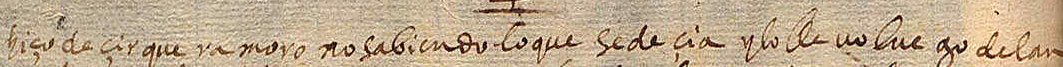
hiço deçir quera moro no sabiendo lo que se decia y lo lleuo luego delan
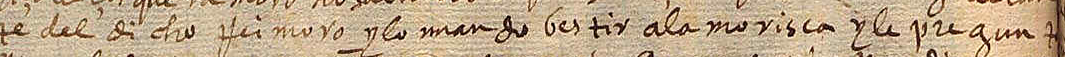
te del dicho Rei moro y lo mando vestir a la morisca y le pregunt
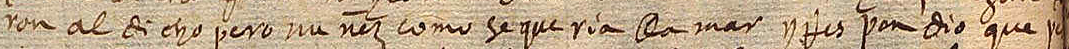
ron al dicho pero nun̄ez como se queria llamar y Respondio que pe
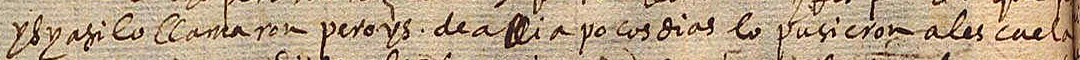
ys y asi lo llamaron pero ys de alli a pocos dias lo pusieron a lescuela
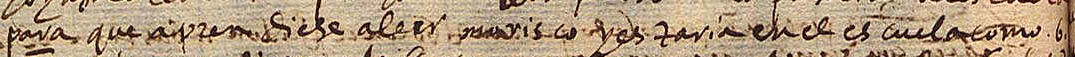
para que aprendiese a leer morisco y estaria en el escuela como b
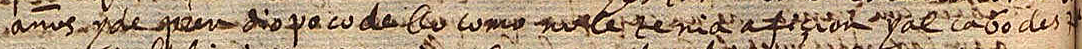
an̄os y deprendio poco dello como no le tenia aficion y al cabo dest
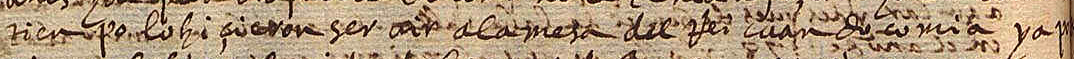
tienpo lo hicieron seruir a la mesa del Rei cuando comia y a po
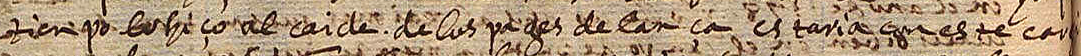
tienpo lo hiço alcaide de los pages de lança estaria en este car
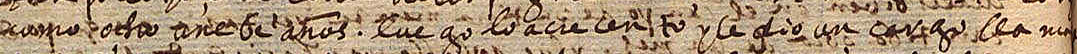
como ocho a nebe anōs. luego lo acrecento y le dio un cargo llama
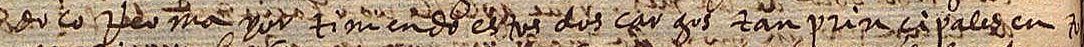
do coReo mayor tiniendo estos dos cargos tan principales en to
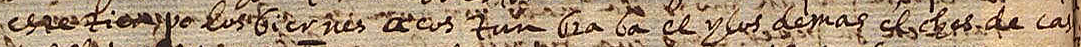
este tienpo los viernes acostunbraba el y los demas elches de cas
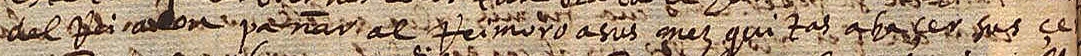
del Rei acompan̄ar al Rei moro a sus mezquitas a hacer sus ce
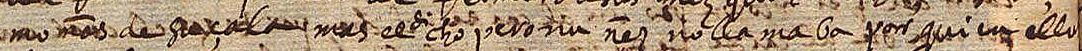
monias de su çala mas el dicho pero nun̄ez no llamaba por quien ello
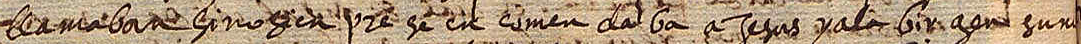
llamaban sino sienpre se encomendaba a Jesus y a la virgen su m
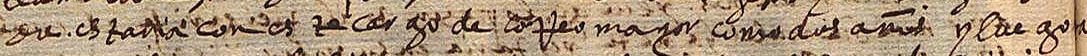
dre. estaria con este cargo de coReo mayor como dos an̄os y luego
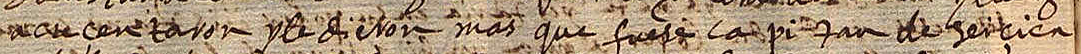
acrecentaron y le dieron mas que fuese capitan de seicien
